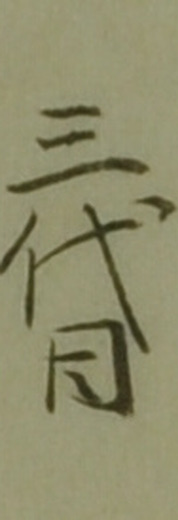三代目
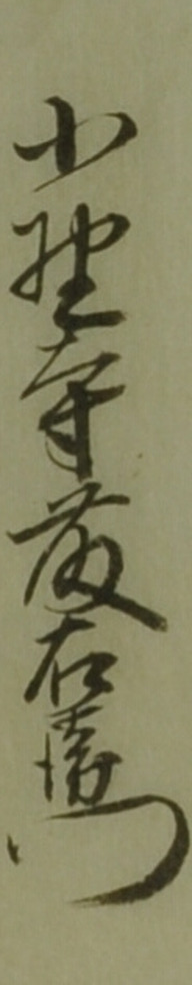小野寺籐右衛門
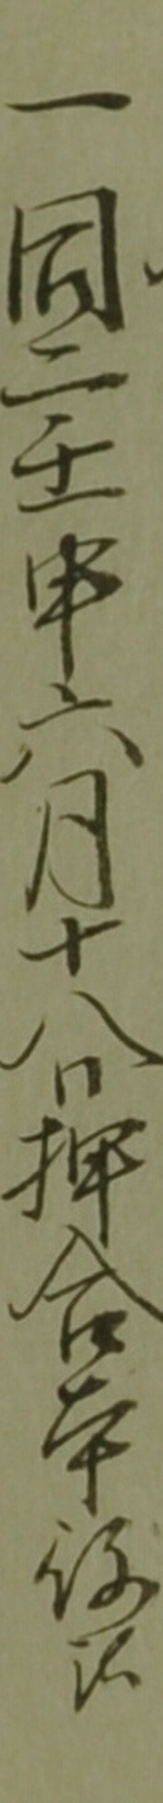一同二壬申六月十八日押合本役被
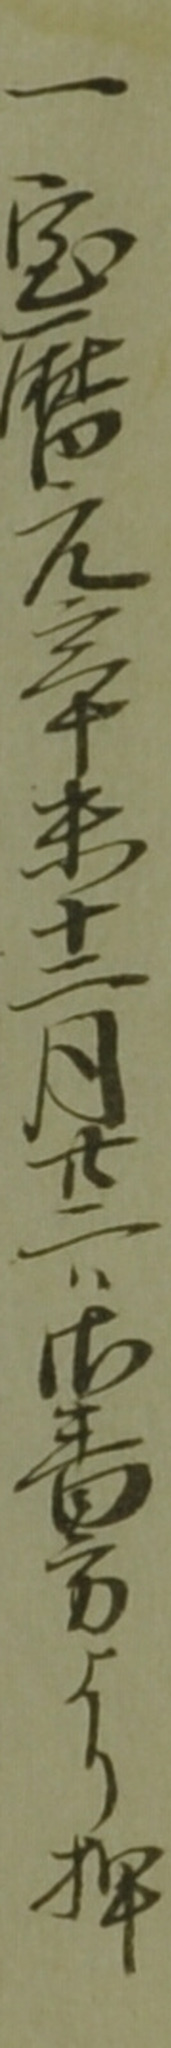一宝暦元辛未十二月廿二日御番方より押
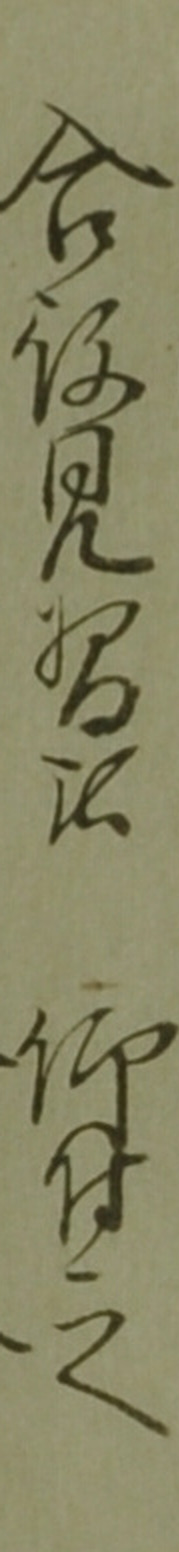合役見習被仰付之
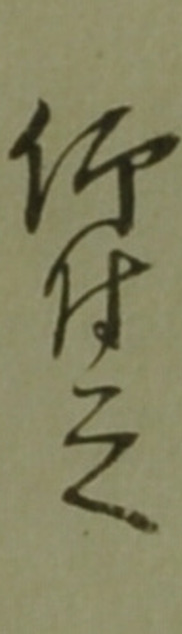仰付之
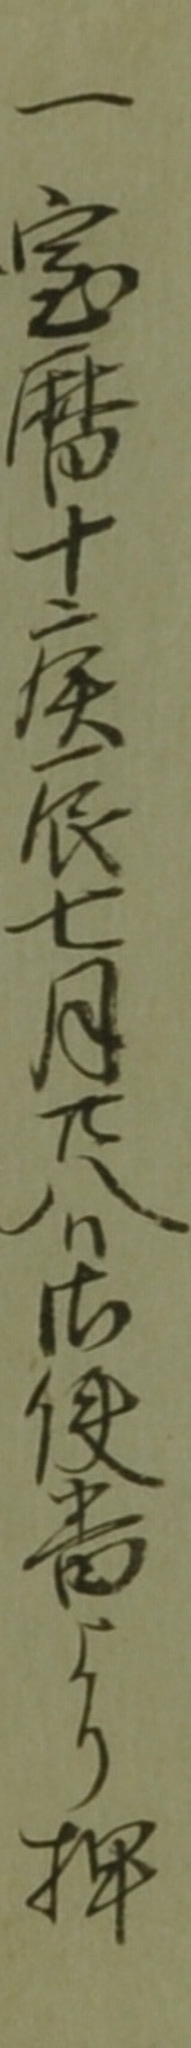一宝暦十庚辰七月廿八日御使番より押
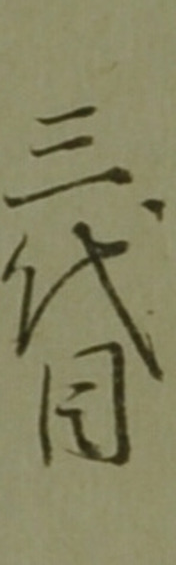三代目
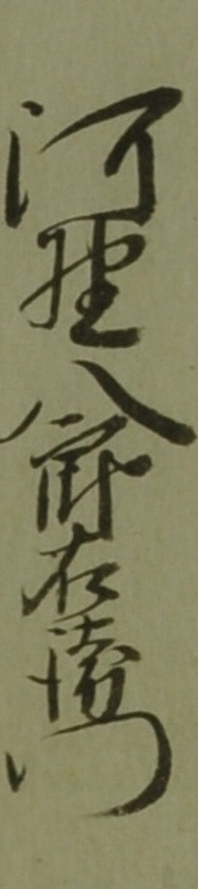河野八郎右衛門
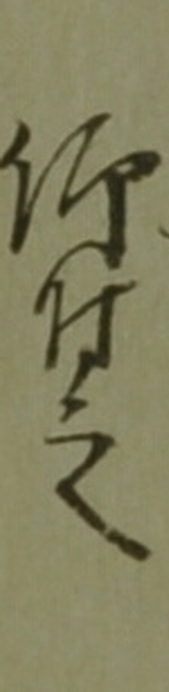仰付之
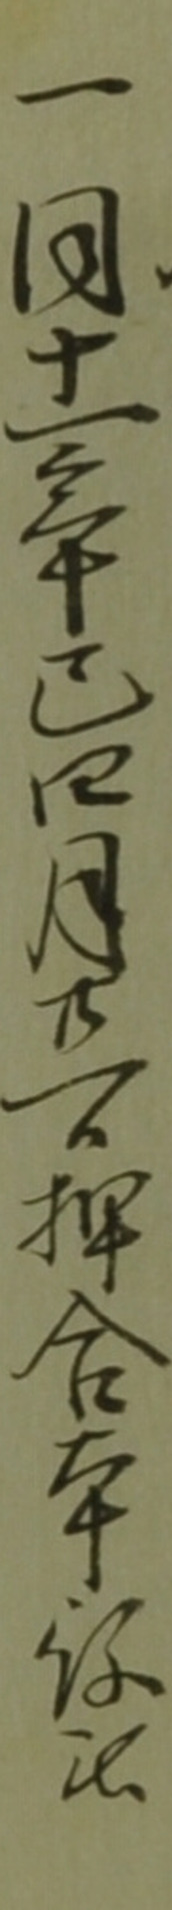一同十一辛巳四月廿一日押合本役被
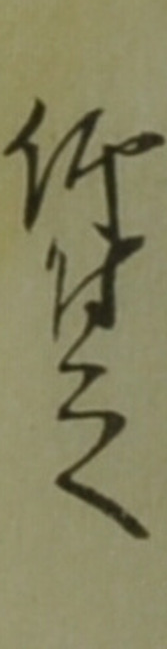仰付之
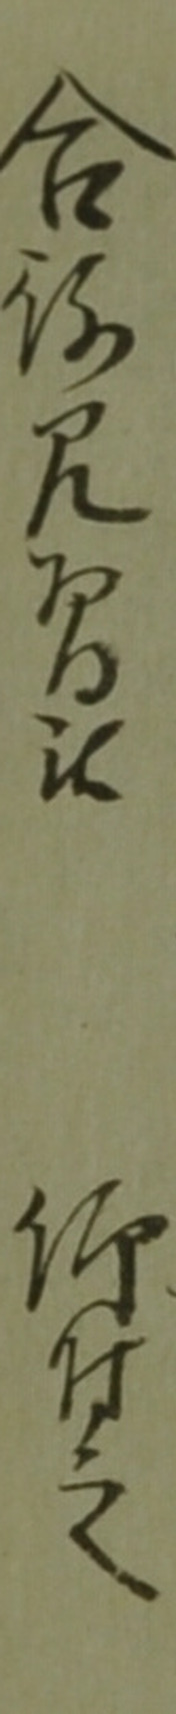合役見習被仰付之

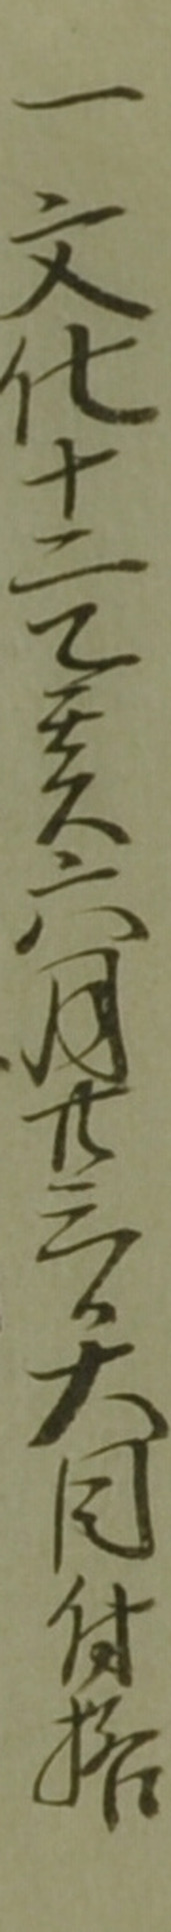一文化十二乙亥六月廿三日大目付格
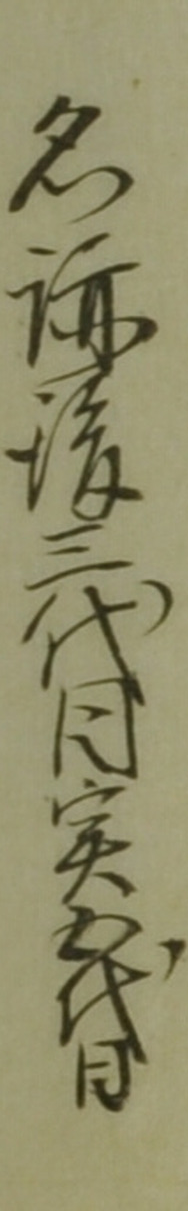名跡後三代目実五代目
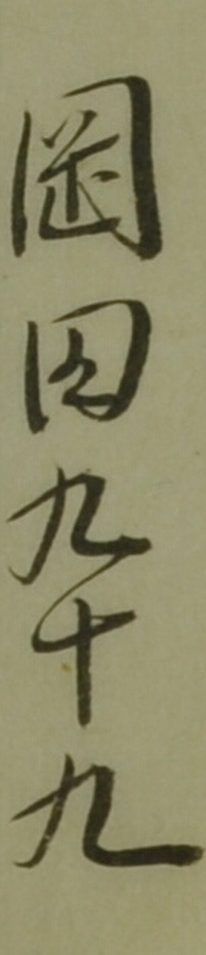奥田九十九
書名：諸御役代々録（七）
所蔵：伊那市立高遠町図書館・合同会社AMANE
